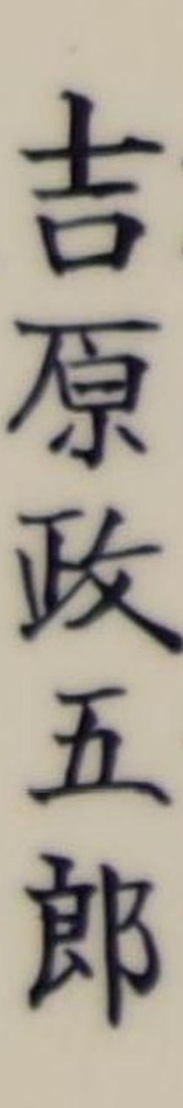吉原政五郎
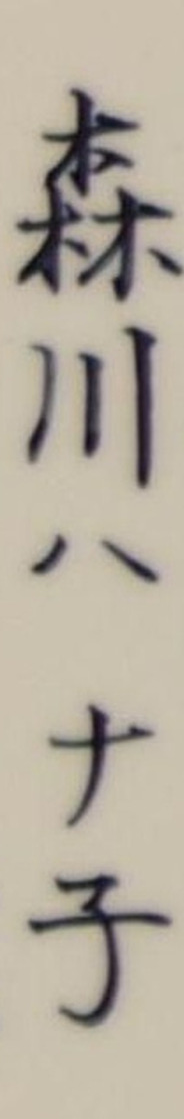森川ハナ子
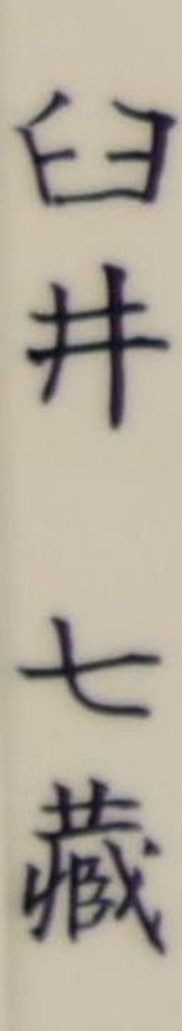臼井七蔵

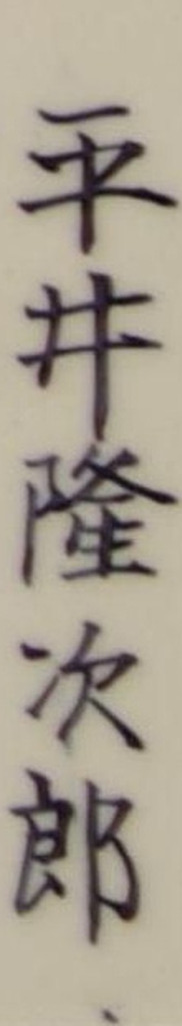平井隆次郎
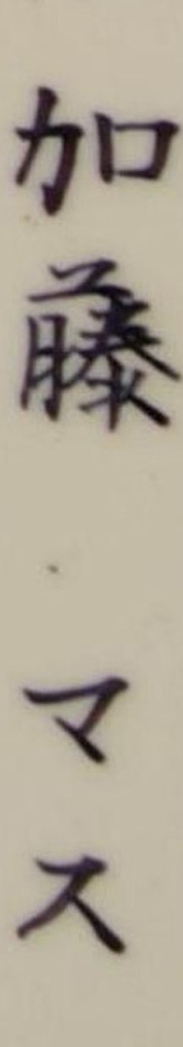加藤マス
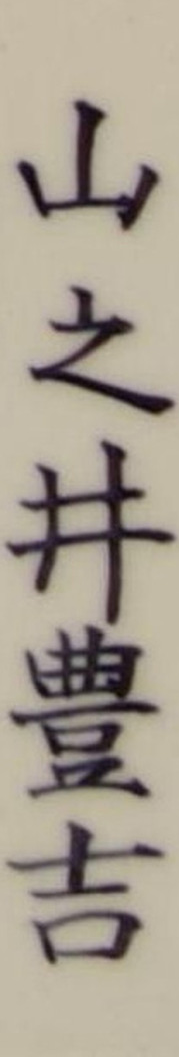山之井豊吉
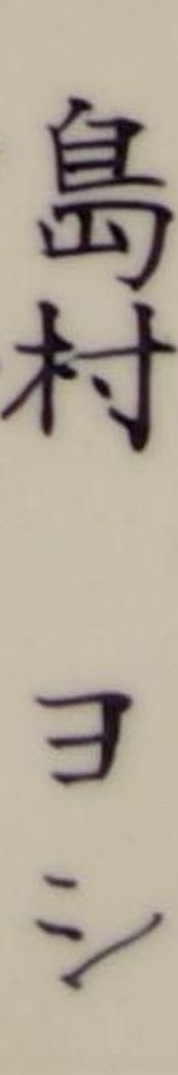島村ヨシ
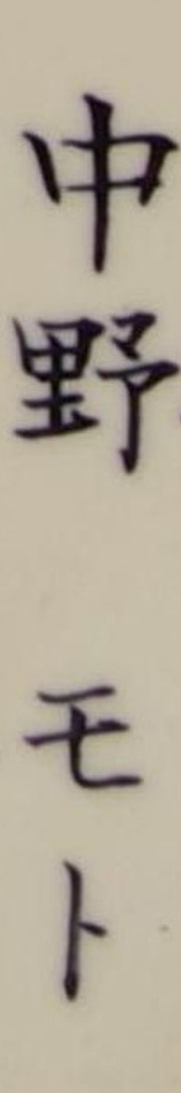中野モト
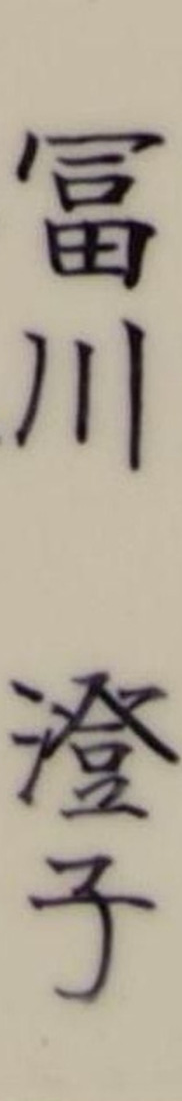冨川澄子
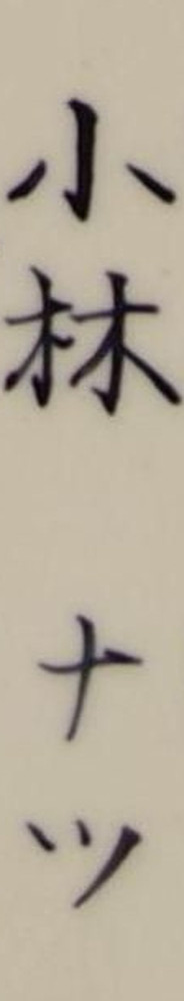小林ナツ
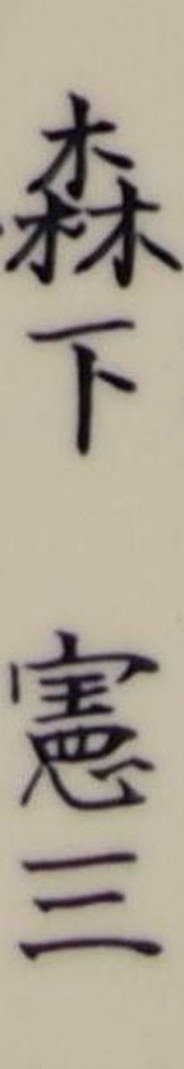森下憲三
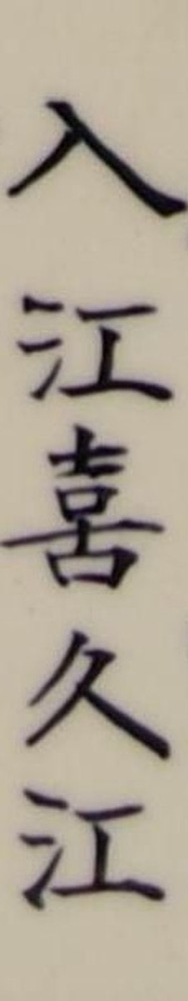入江喜久江
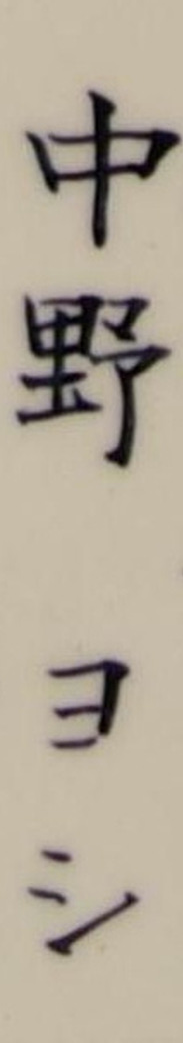中野ヨシ
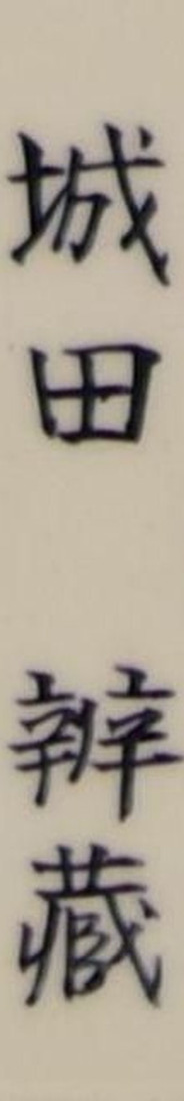城田辨蔵
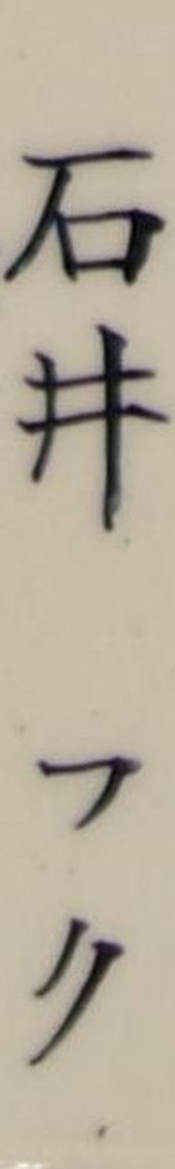石井フク
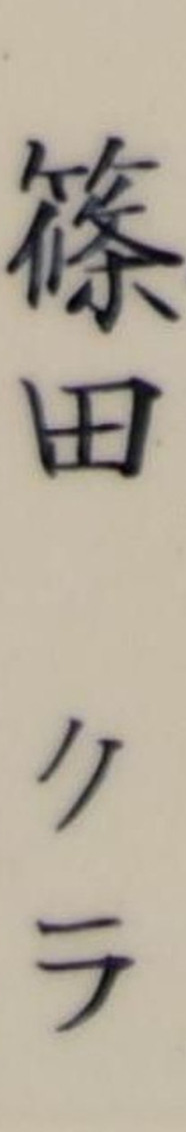篠田クラ
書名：M~S
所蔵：高野山金剛峯寺
